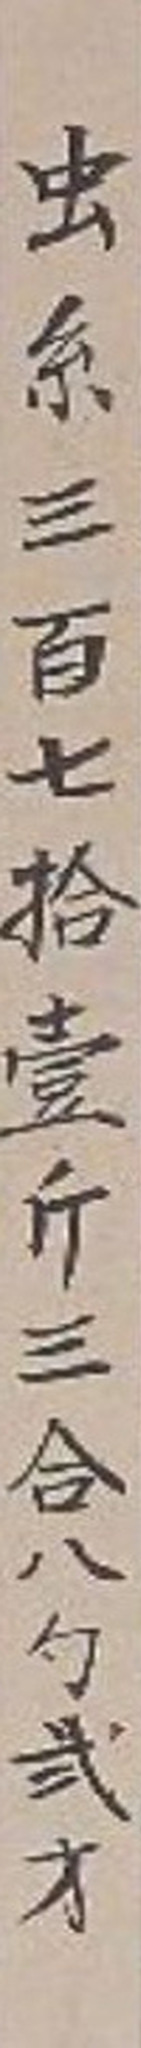虫糸三百七拾壹斤三合八勺弐才
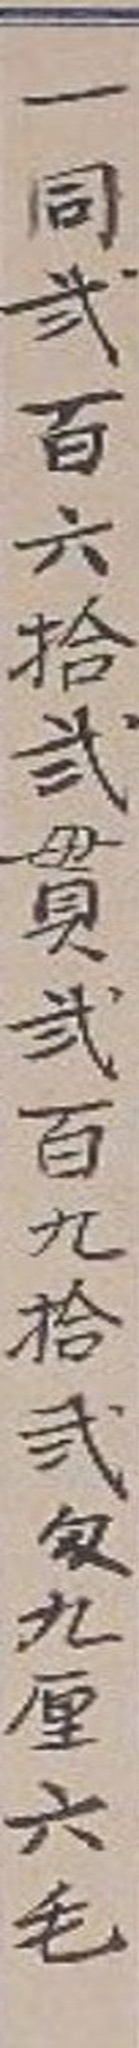一同弐百六拾弐貫弐百九拾弐匁九厘六毛
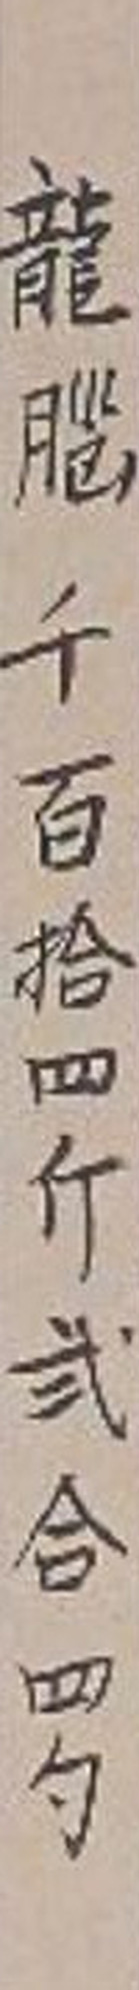龍腦千百拾四斤弐合四勺
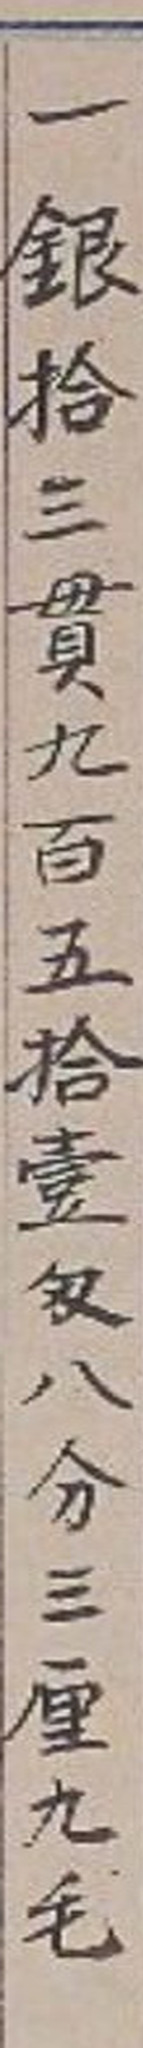一銀拾三貫九百五拾壹匁八分三厘九毛
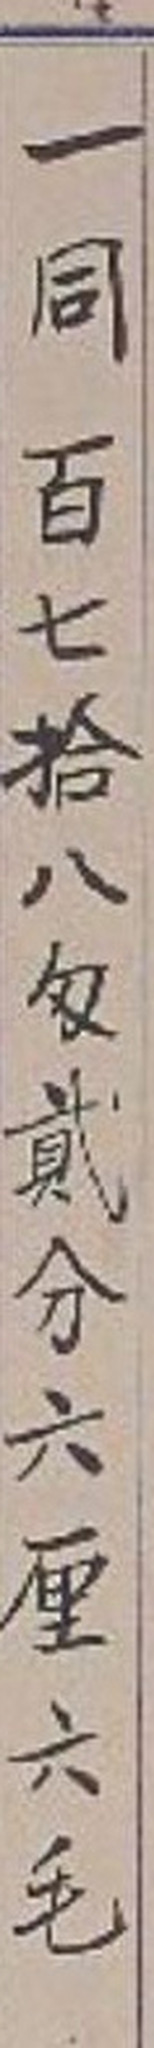一同百七拾八匁貳分六厘六毛
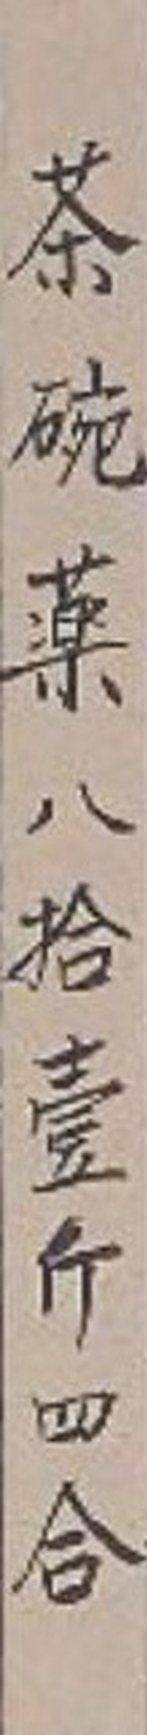茶碗薬八拾壹斤四合

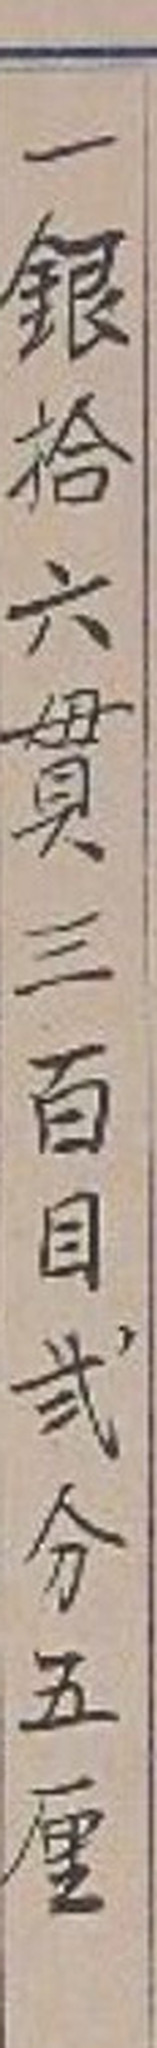一銀拾六貫三百目弐分五厘
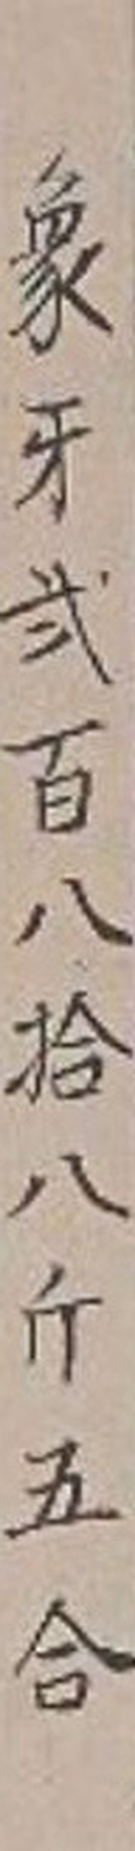象牙弐百八拾八斤五合
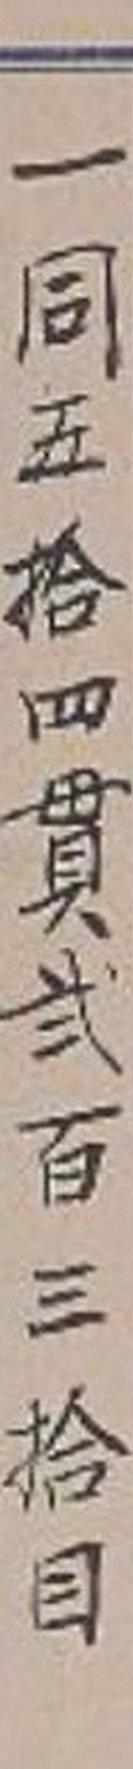一同五拾四貫弐百三拾目
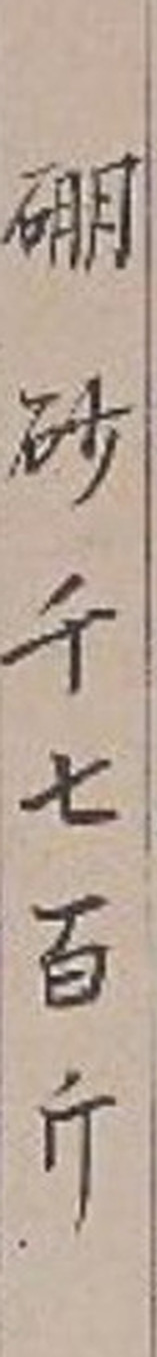硼砂千七百斤
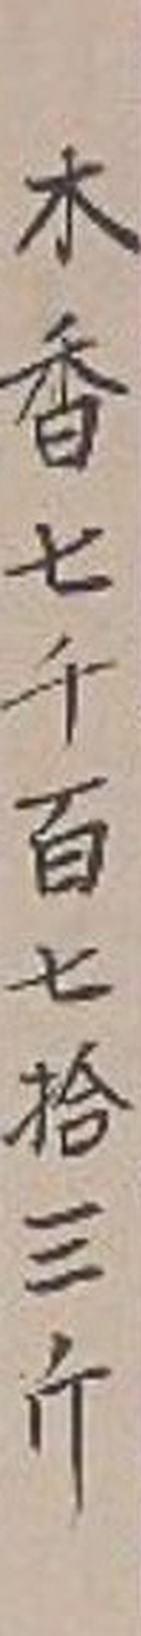木香七千百七拾三斤
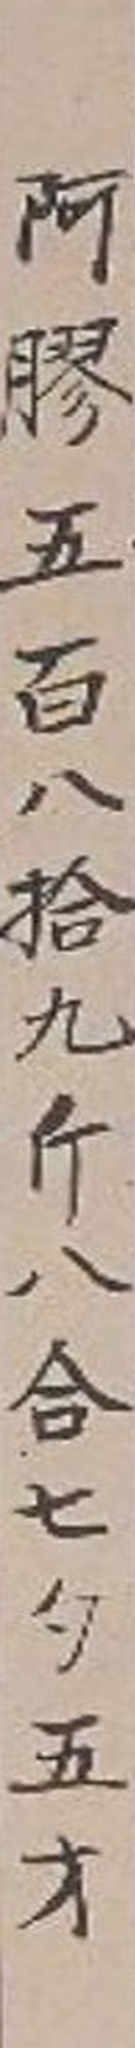阿膠五百八拾九斤八合七勺五才
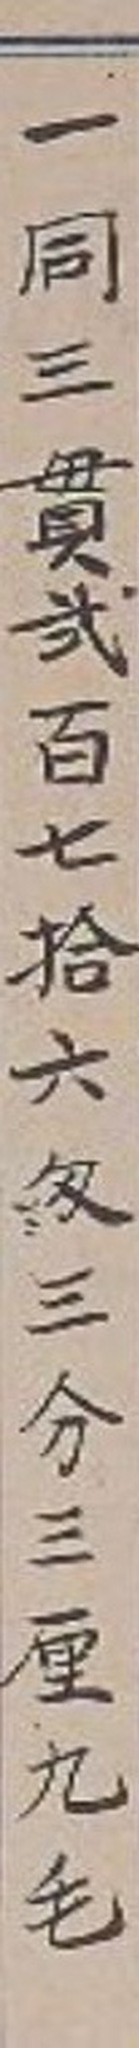一同三貫弐百七拾六匁三分三厘九毛
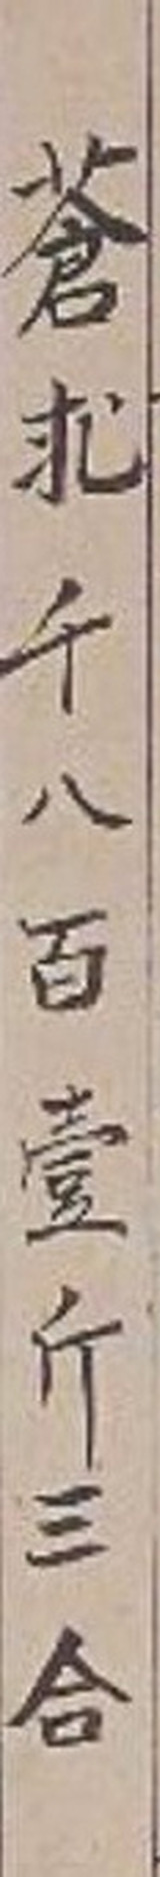蒼求千八百壹斤三合
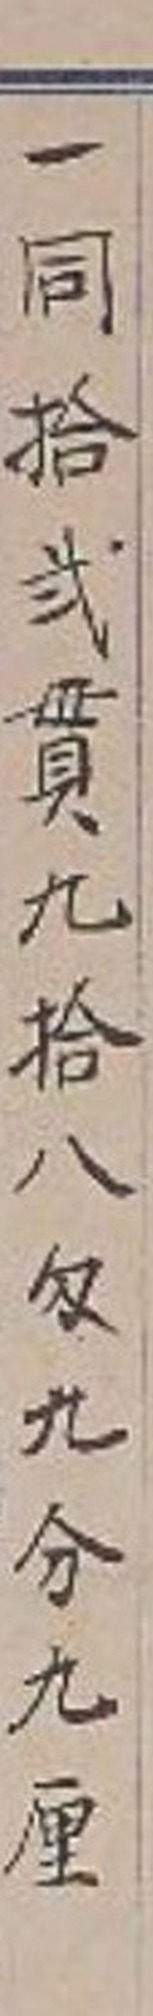一同拾弐貫九拾八匁九分六厘
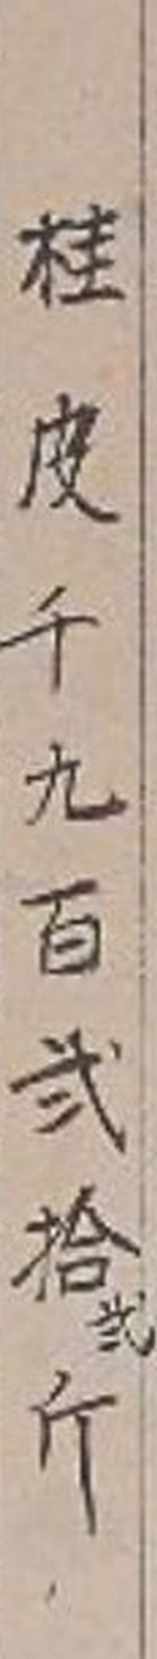桂皮千九百弐拾弐斤
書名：琉球産物於長崎拂立並本手品利潤総帖 弘化四年より酉年迄
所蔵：University of the Ryukyus Library
